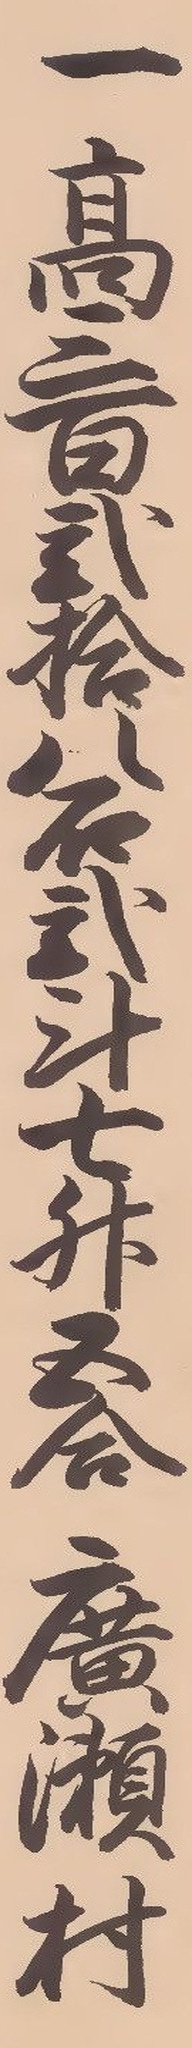一高三百弐拾八石弐斗七升五合広瀬村
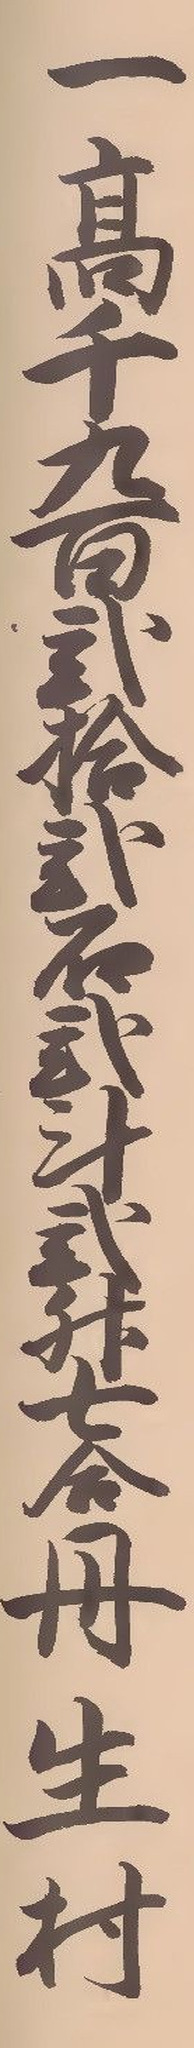一高千九百弐拾弐石弐斗弐升七合丹生村
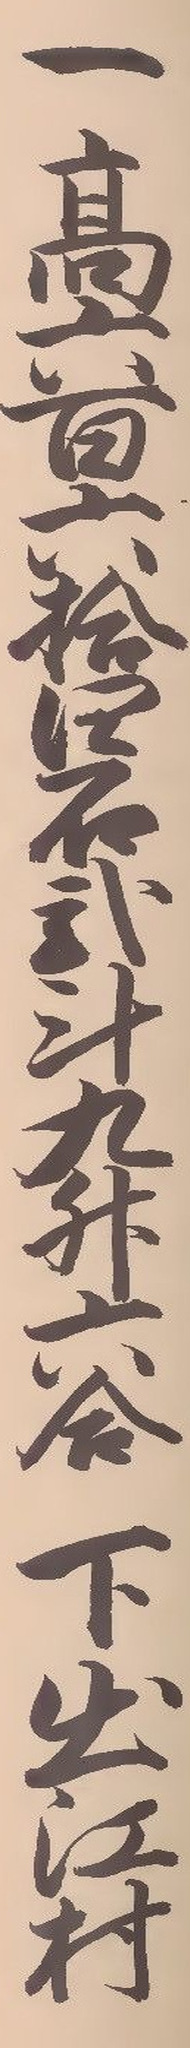一高六百六拾四石弐斗九升六合下出江村
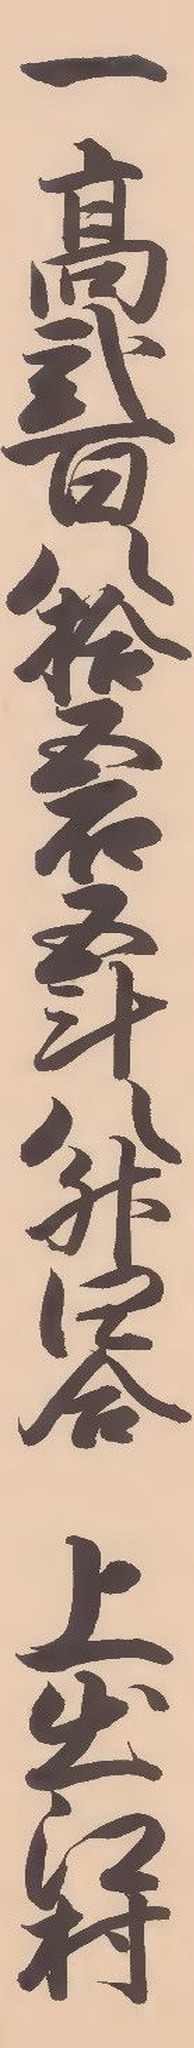一高弐百八拾五石五斗八升四合上出江村
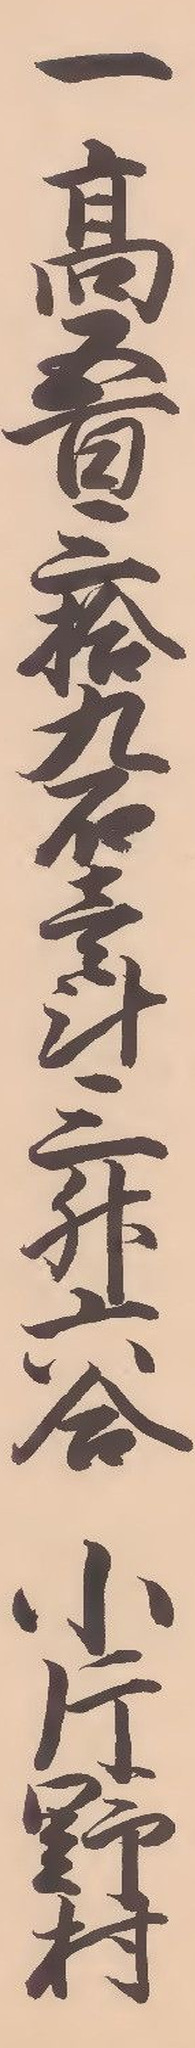一高五百三拾九石壱斗三升六合小片野村
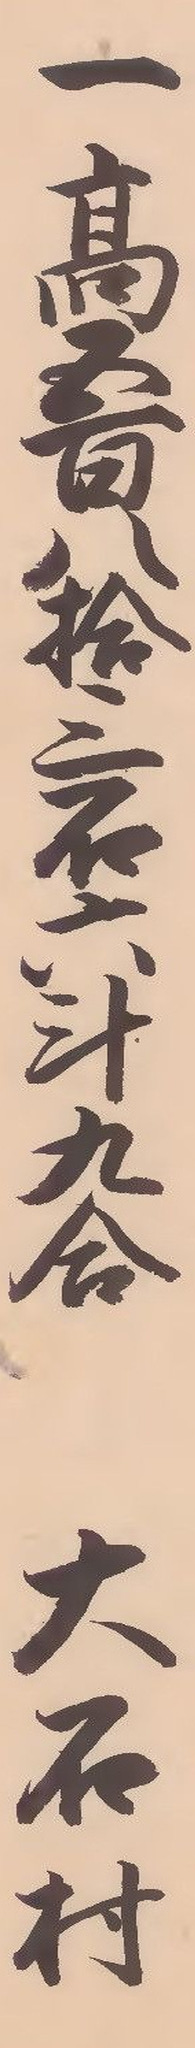一高五百八拾三石六斗九合大石村

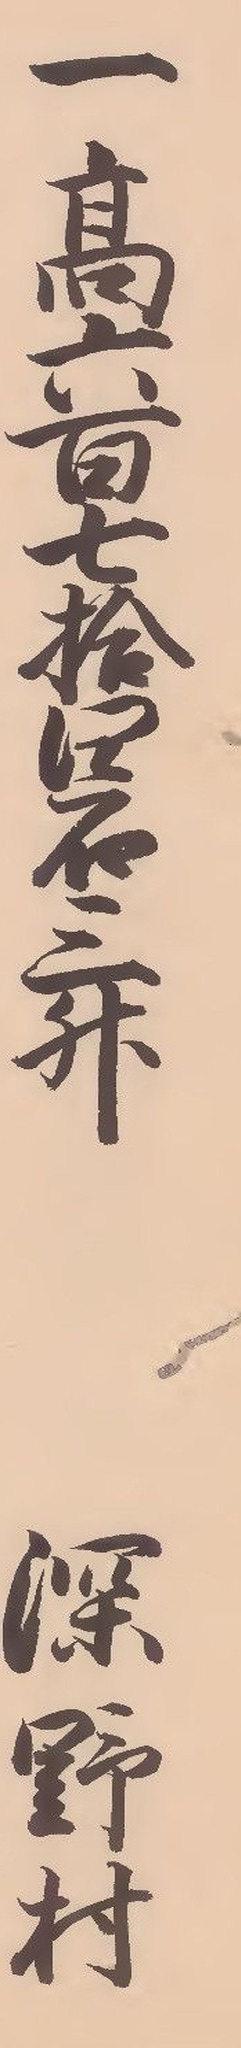一高六百七拾四石三升深野村
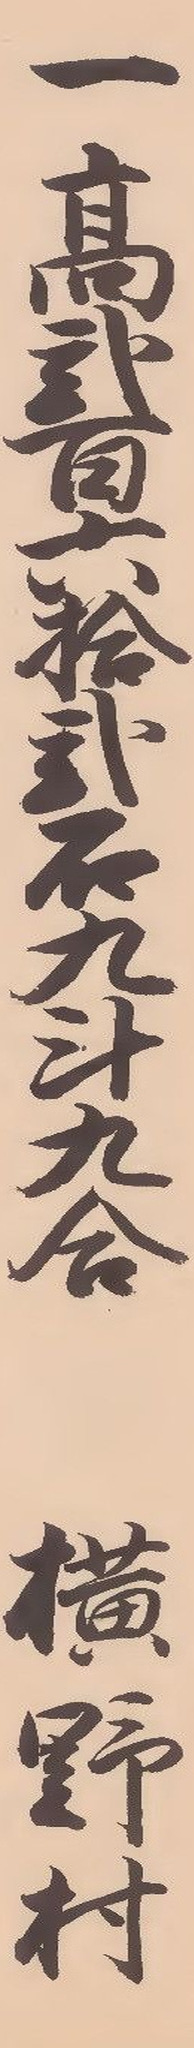一高弐百六拾弐石九斗九合横野村
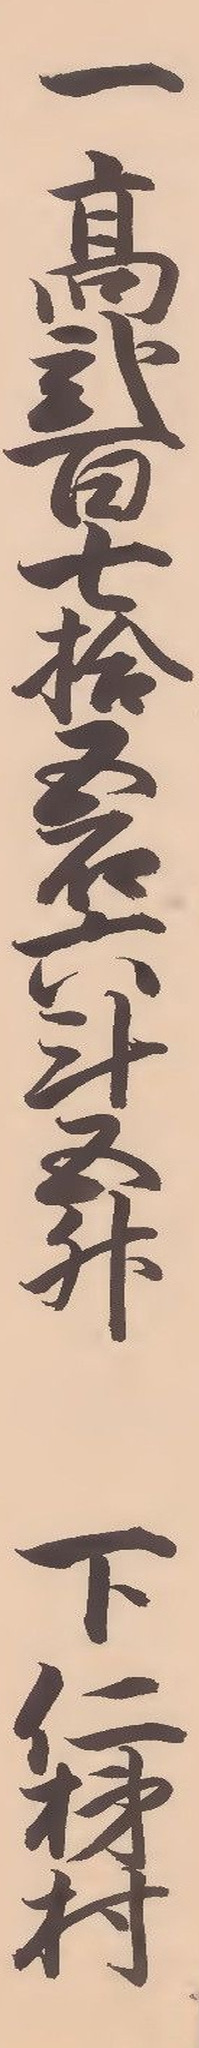一高弐百七拾五石六斗五升下仁柿村
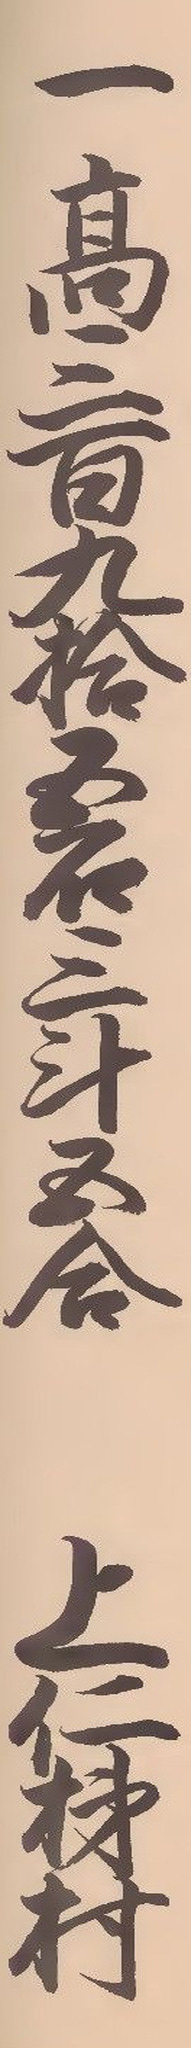一高三百九拾五石三斗五合上仁柿村
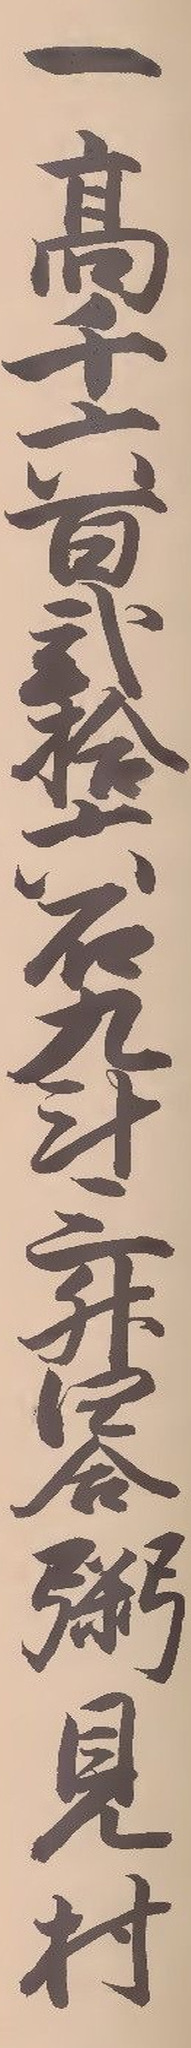一高千六百弐拾六石九斗三升四合粥見村
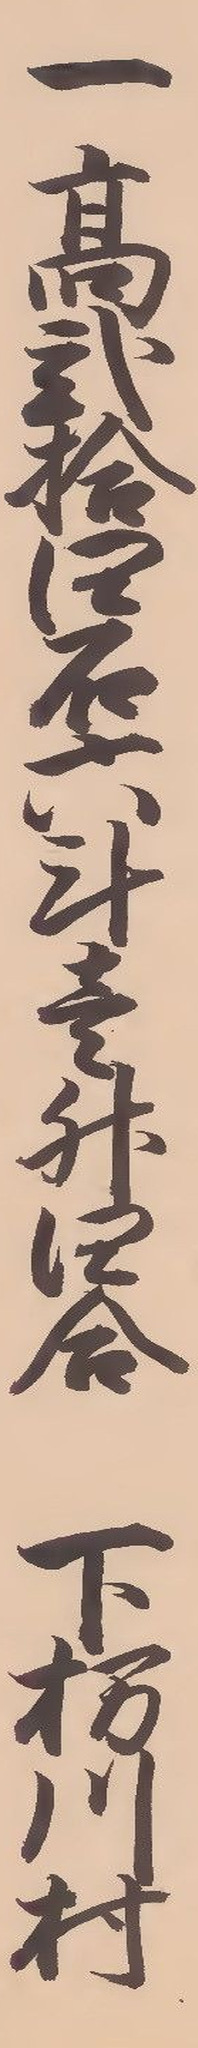一高弐拾四石六斗壱升四合下栃川村
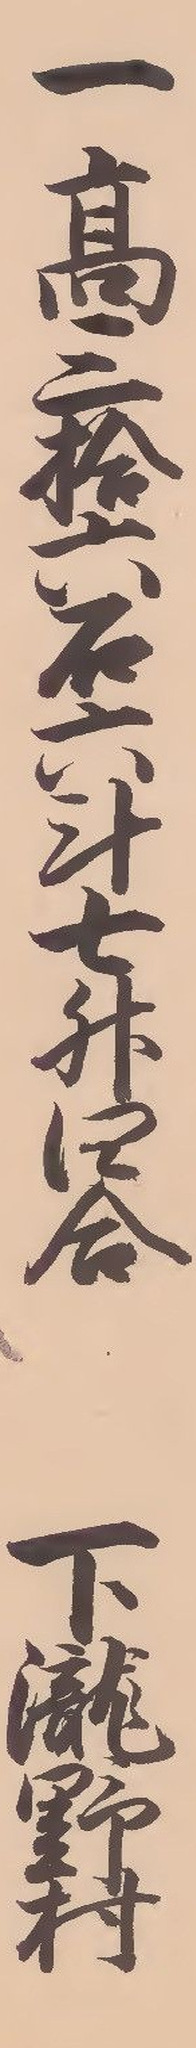一高三拾六石六斗七升四合下滝野村

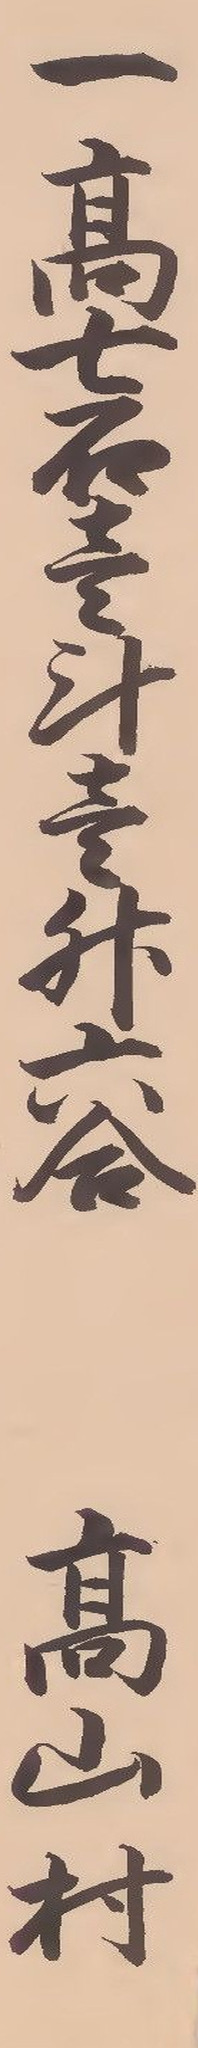一高七石壱斗壱升六合高山村
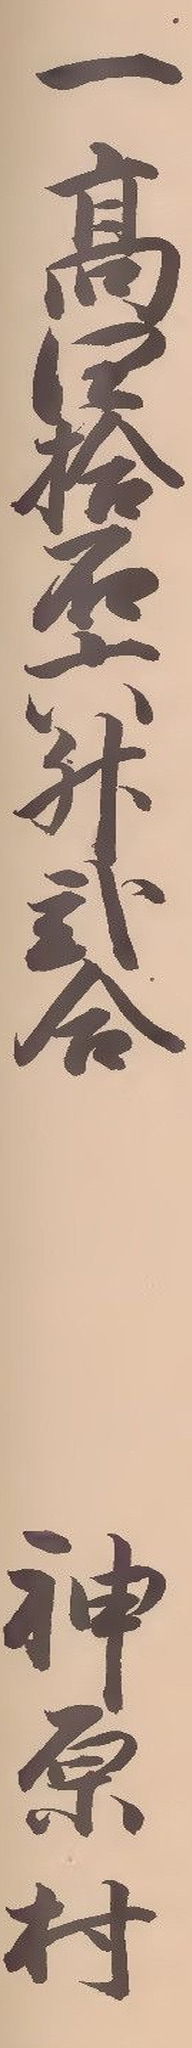一高四拾石六升弐合神原村
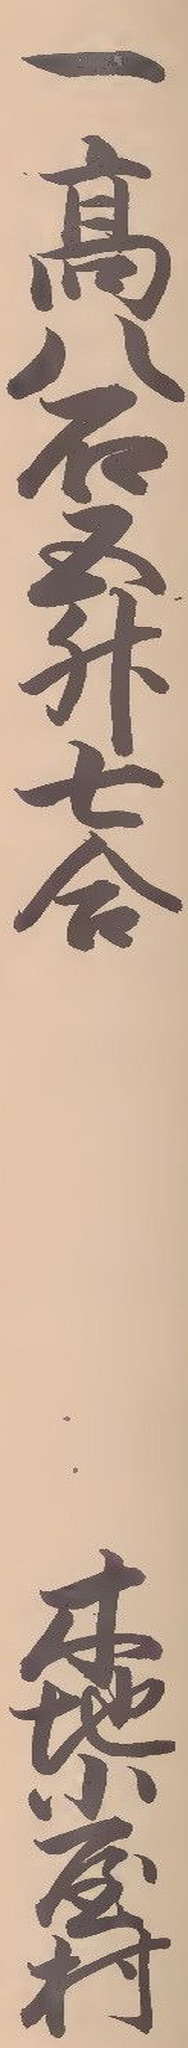一高八石五升七合木地小屋村
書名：伊勢国郷帳
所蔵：国立公文書館 National Archives of Japan
